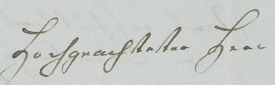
Hochgeachteter Herr.
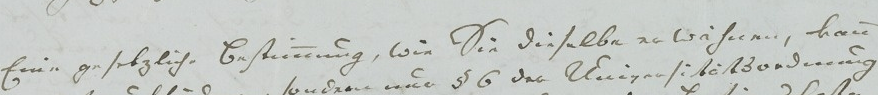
Eine gesetzliche Bestimmung, wie Sie dieselbe erwähnen, kann
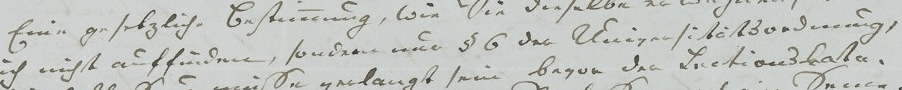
ich nicht auffinden, sondern nur § 6 der Universitätsordnung,
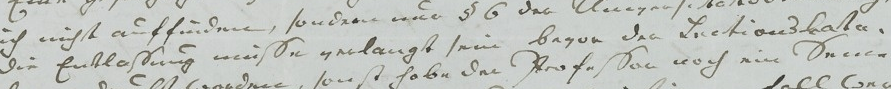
die Entlassung müsse verlangt sein bevor der Lectionskata-
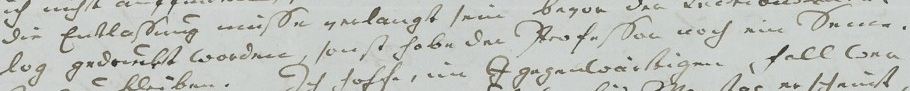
log gedruckt worden, sonst habe der Professor noch ein Seme-
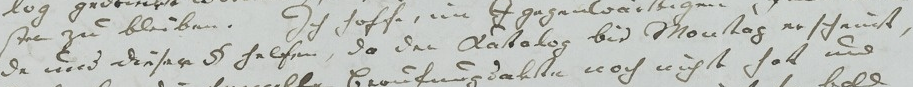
de uns dieser § helfen, da der Katalog bis Montag erscheint,
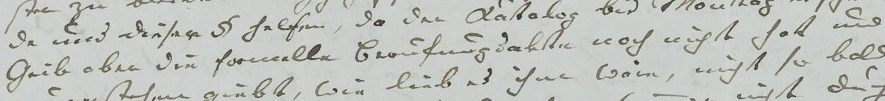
Geib aber die formelle Berufungsakte noch nicht hat und
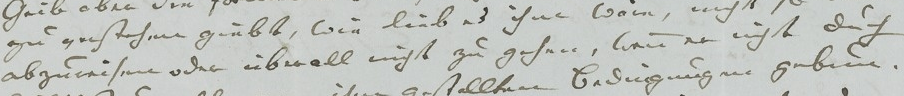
abzureisen oder überall nicht zu gehen, wenn er nicht durch
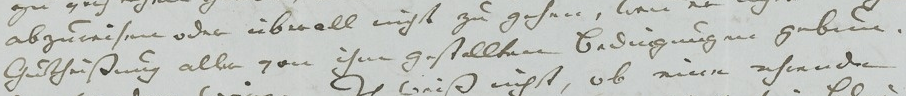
Gutheißung aller von ihm gestellten Bedingungen gebun-
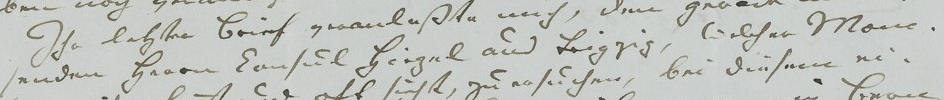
senden Herrn Consul Hirzel aus Leipzig, welcher Mom-
